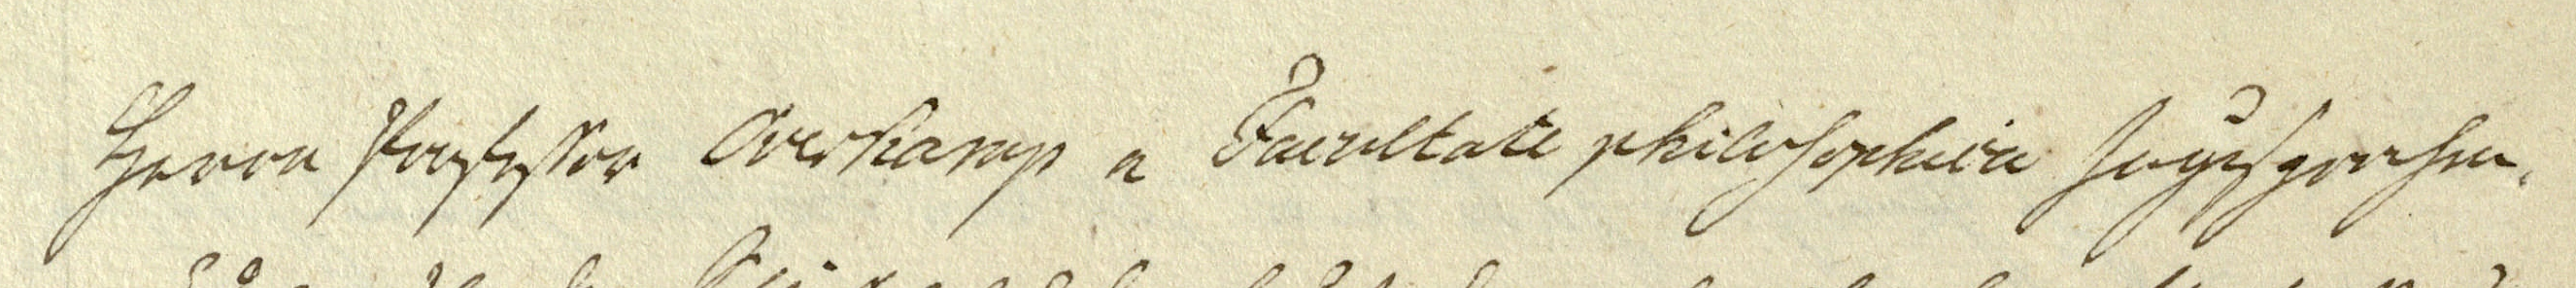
Herrn Professor Overkamp a Facultate philosophica zugesprochen,
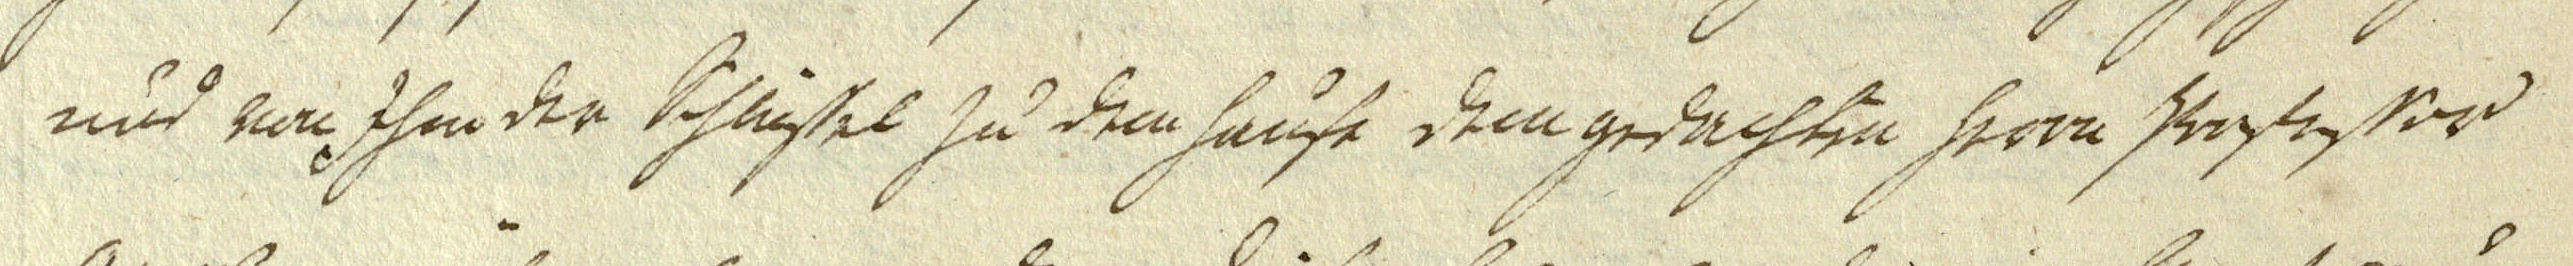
und von ihm der Schlüssel zu dem Hause dem gedachten Herrn Professor
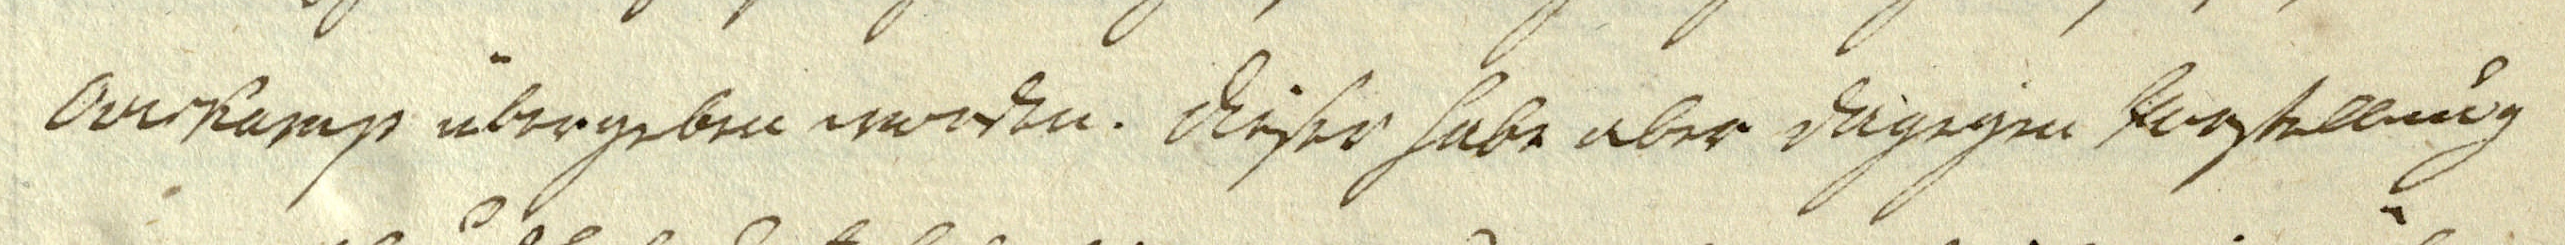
Overkamp übergeben worden. Dieser habe aber dagegen Vorstellung
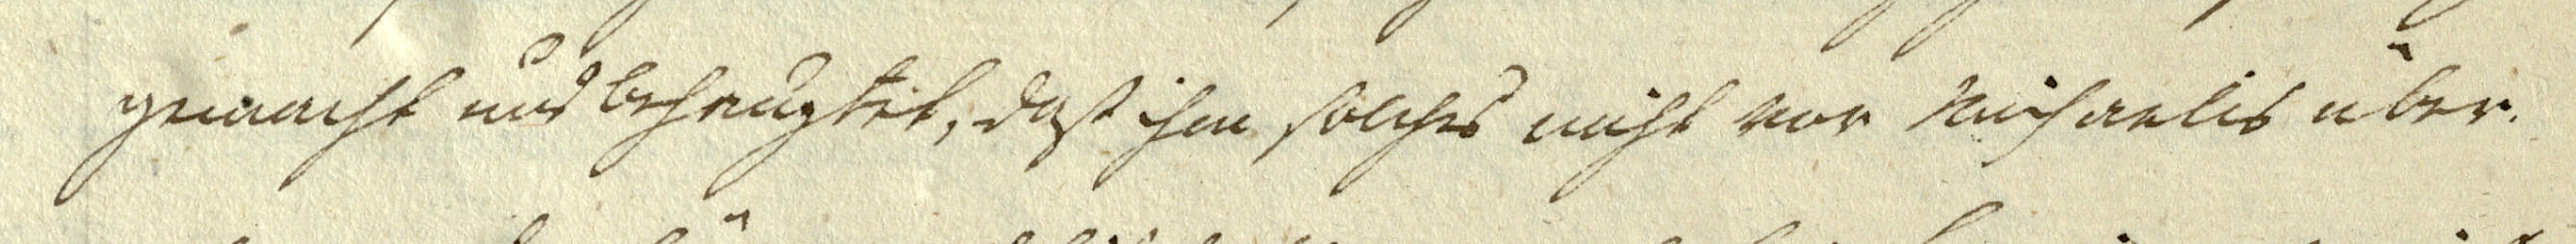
gemacht und behauptet, daß ihm solches nicht vor Michaelis über¬
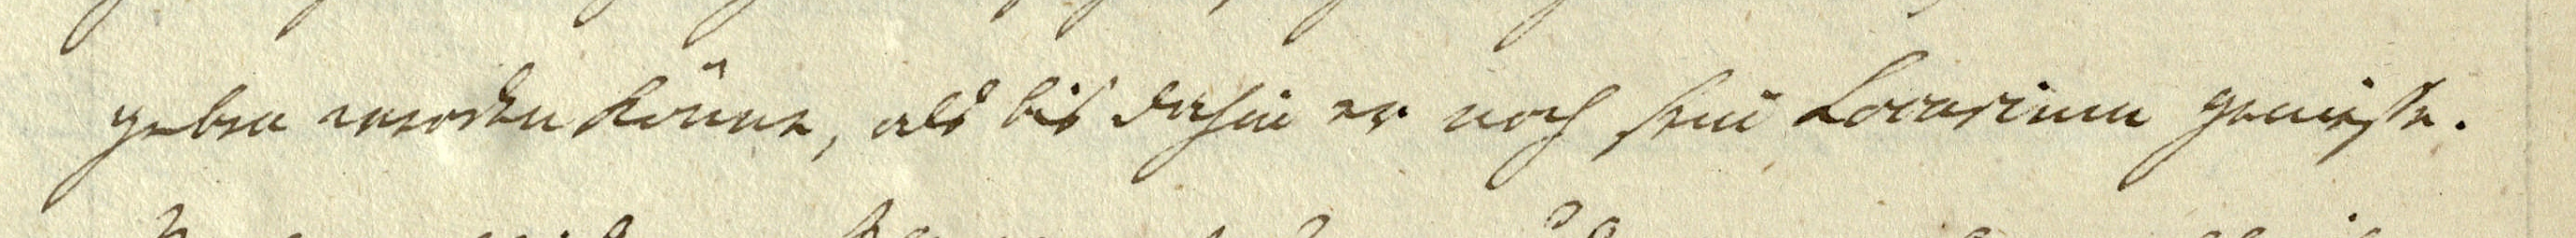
geben werden könne, als bis dahin er noch sein Locarium geniesse.
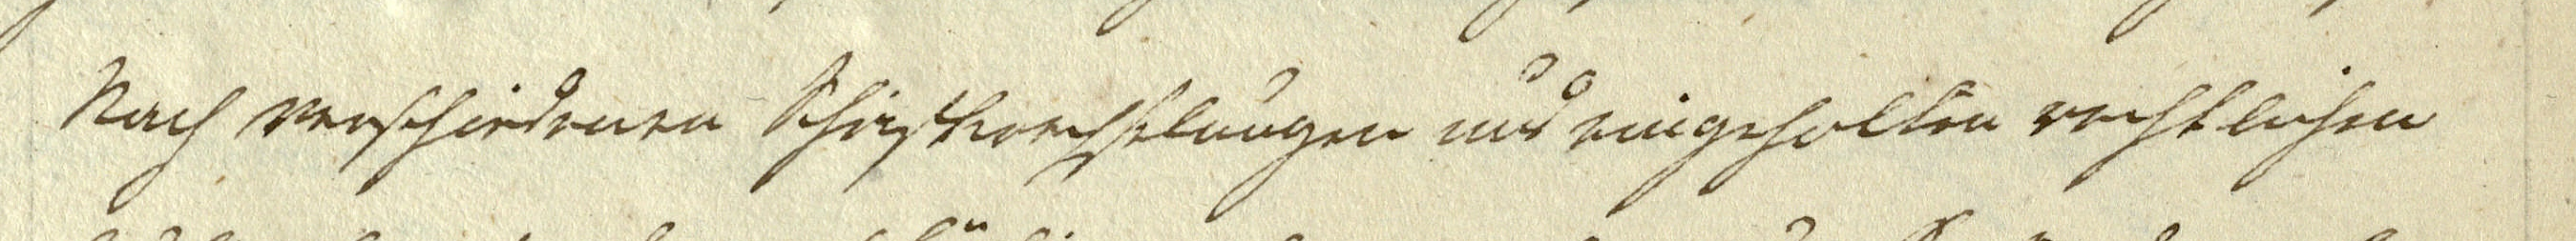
Nach verschiedenen Schriftwechselungen und eingeholten rechtlichen
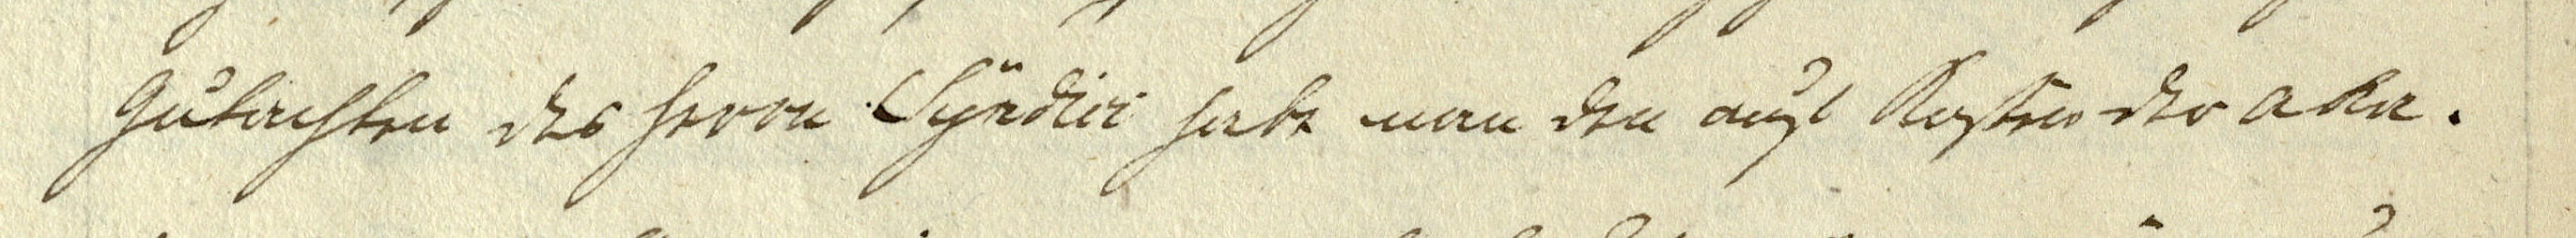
Gutachten des Herrn Sÿndici habe man den auf Kosten der Aka¬
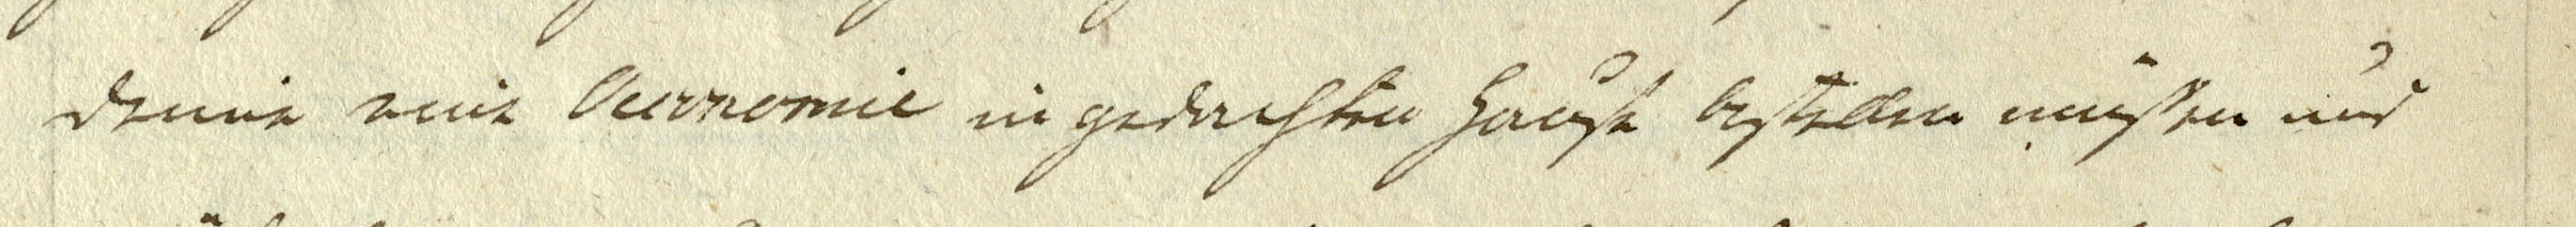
demie eine Oeconomie in gedachten Hause bestellen müssen und
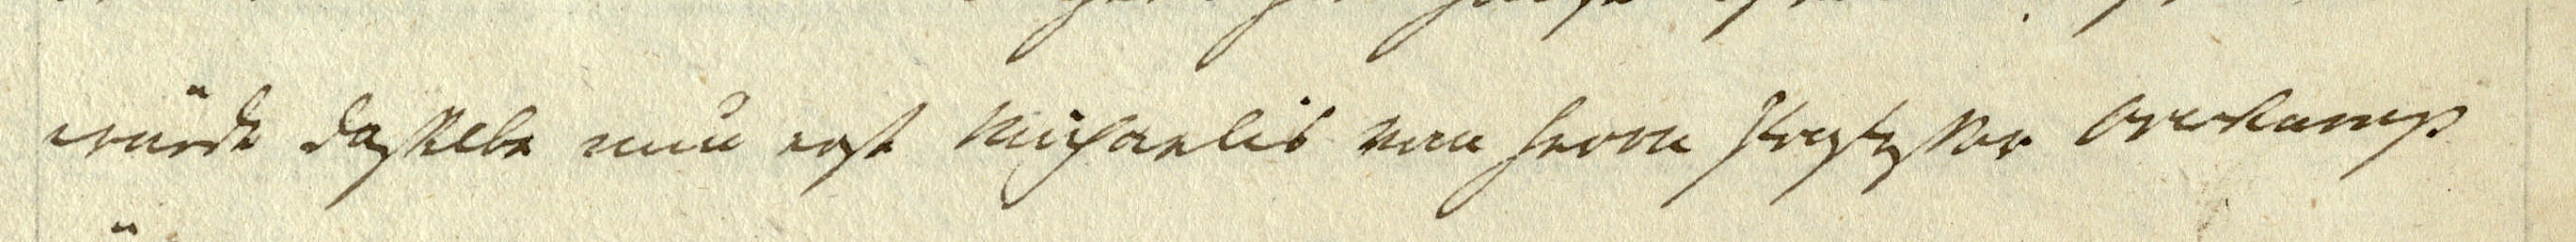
würde dasselbe nun erst Michaelis von Herrn Professor Overkamp
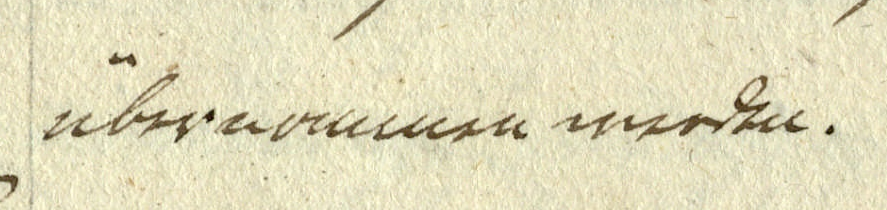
übernommen werden.
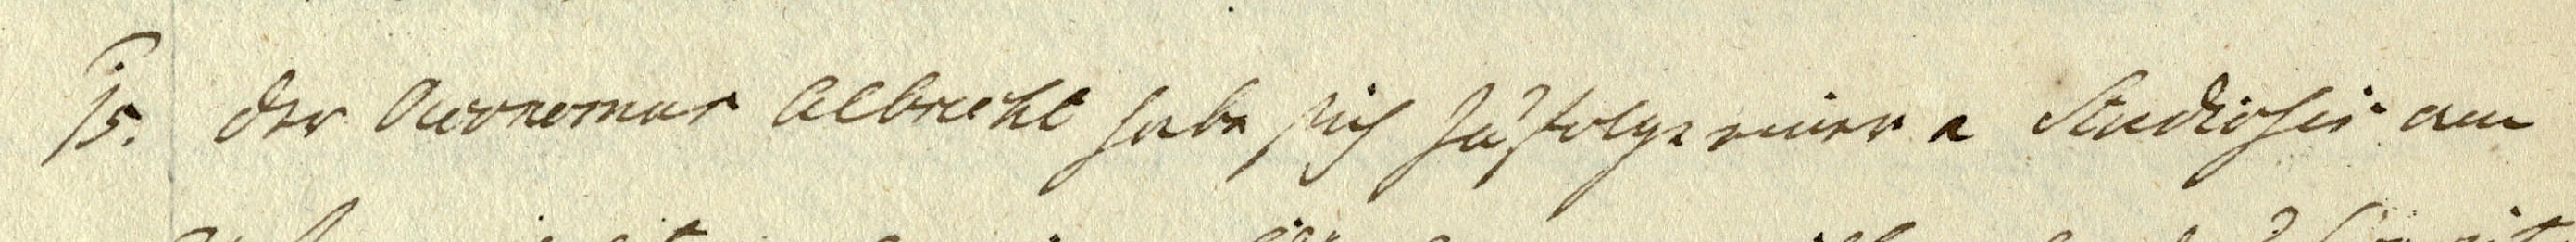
15. Der Oeconomus Albrecht habe sich zufolge einer a Studiosis am
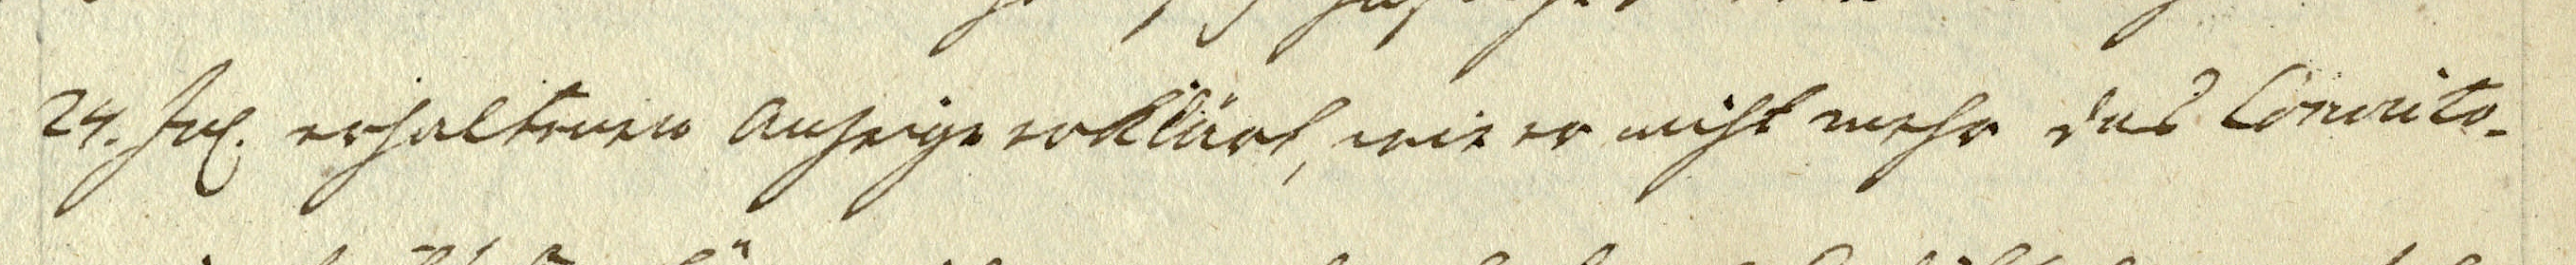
24. Jul.. erhaltenen Anzeige erklärt, wie er nicht mehr das Convicto¬
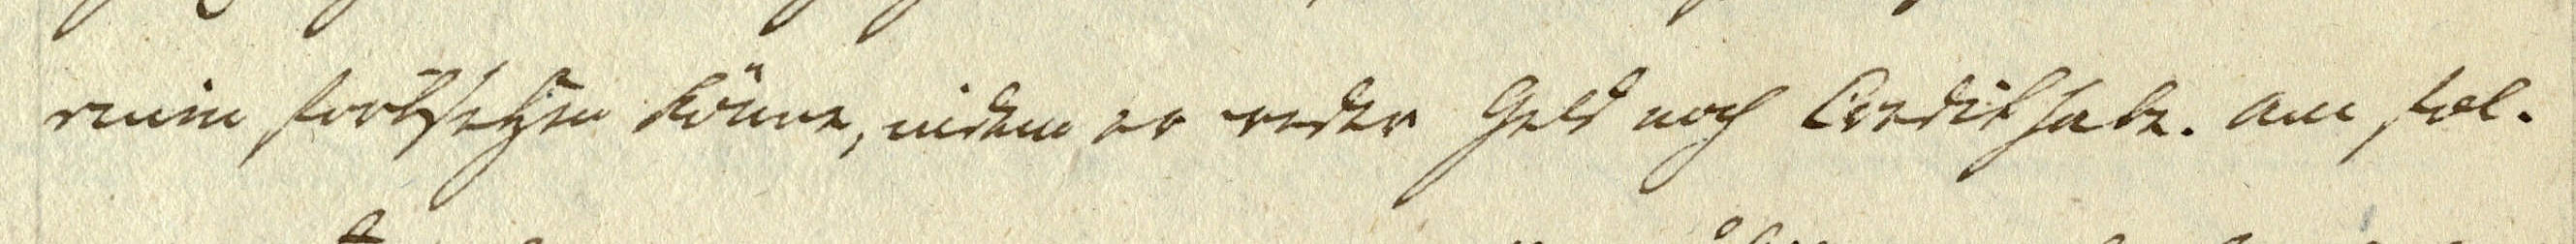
rium fortsetzen könne, indem er weder Geld noch Credit habe. Am fol¬
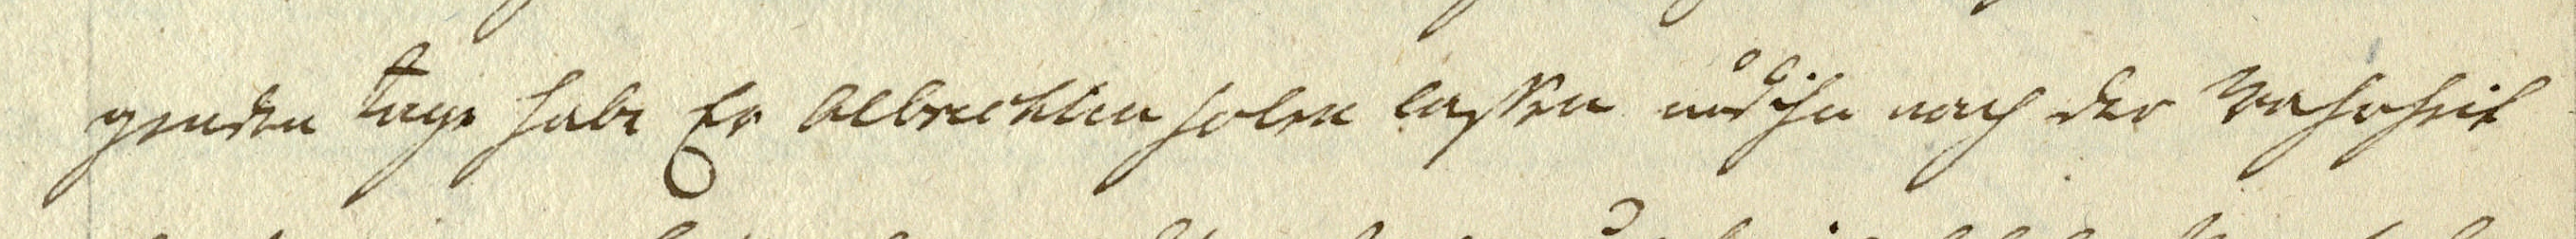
genden Tage habe Er Albrechten holen lassen undihn nach der Wahrheit
